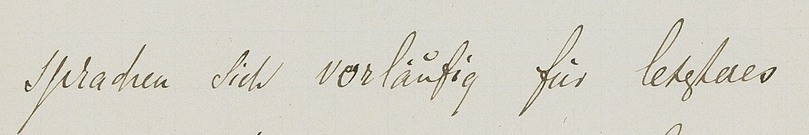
sprachen sich vorläufig für letzteres
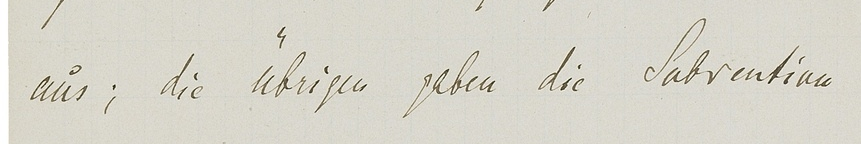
aus; die übrigen gaben die Subvention
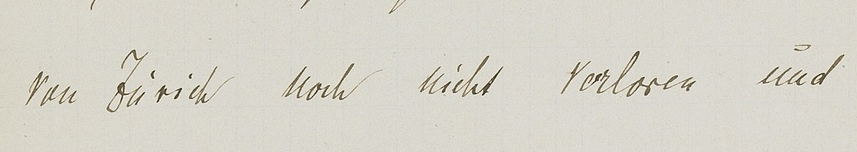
von Zürich noch nicht verloren und
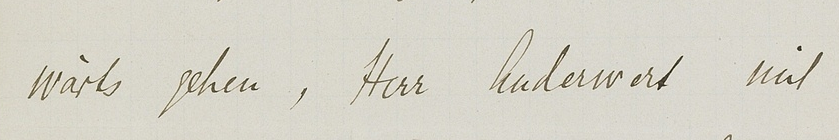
wärts gehen, Herr Anderwert mit
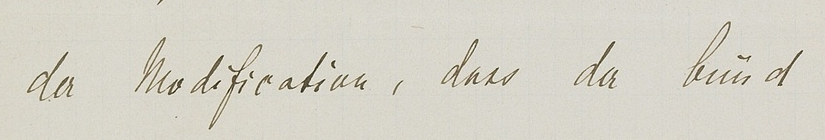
der Modification, dass der Bund
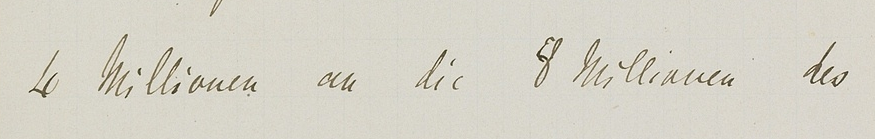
4 Millionen an die 8 Millionen des
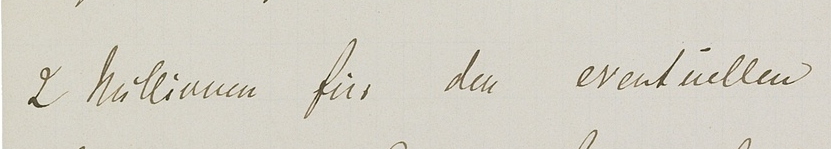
2 Millionen für den eventuellen
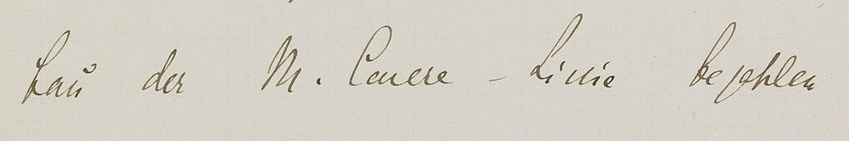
Bau der M. Cenere-Linie bezahlen
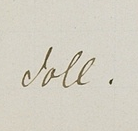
soll.
